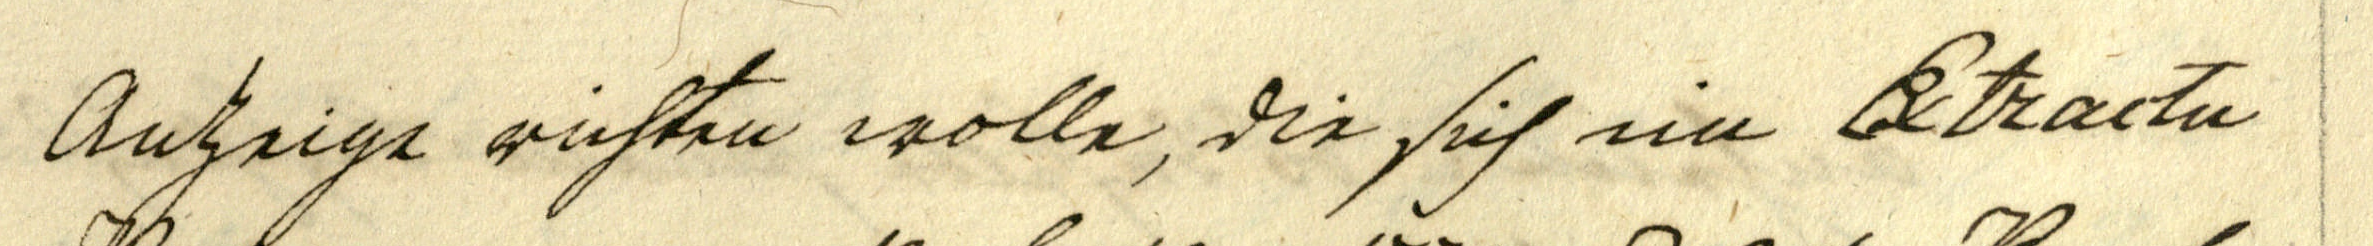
Anzeige richten wolle, die sich im Extractu
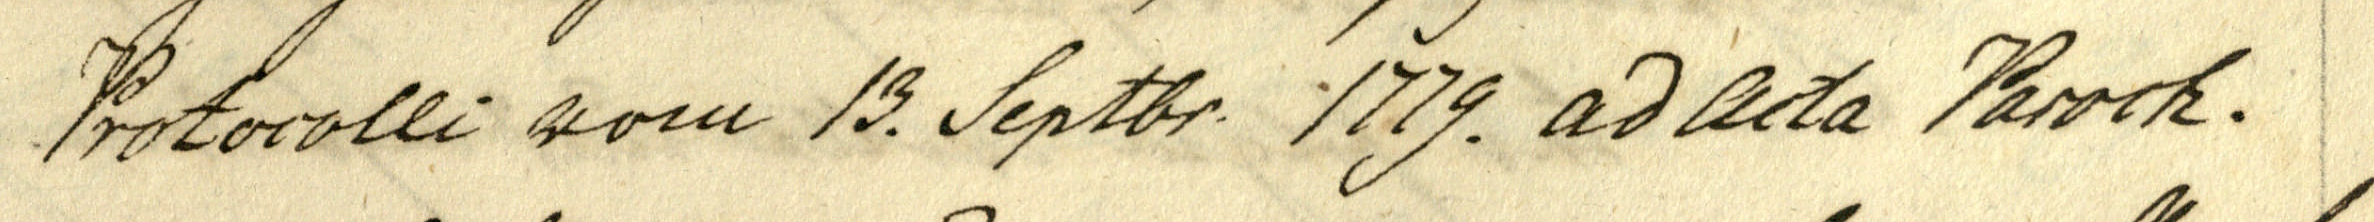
Protocolli vom 13. Septbr. 1779. ad Acta Paroch.
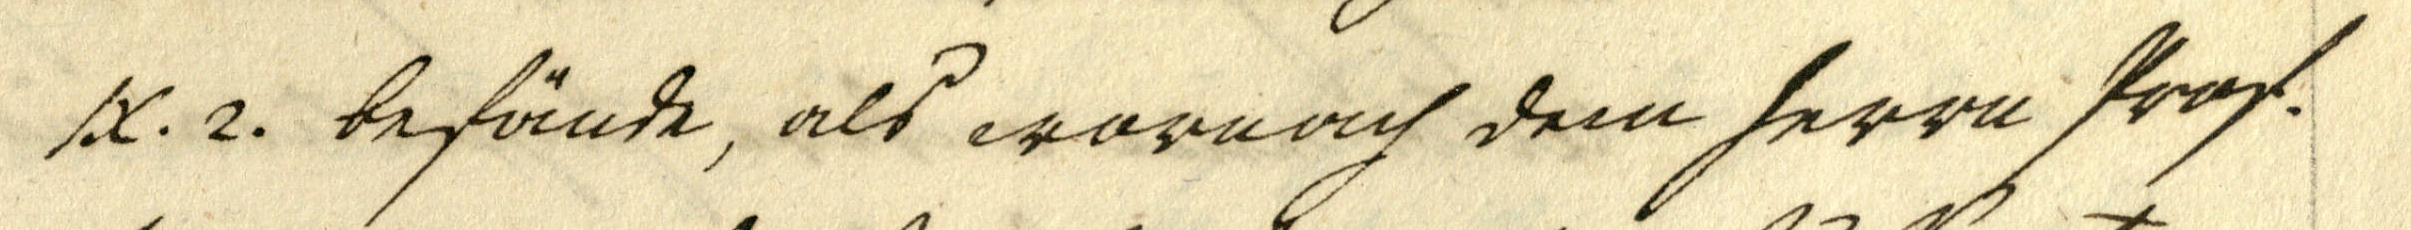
IX.2. befände, als wornach dem herrn Prof.
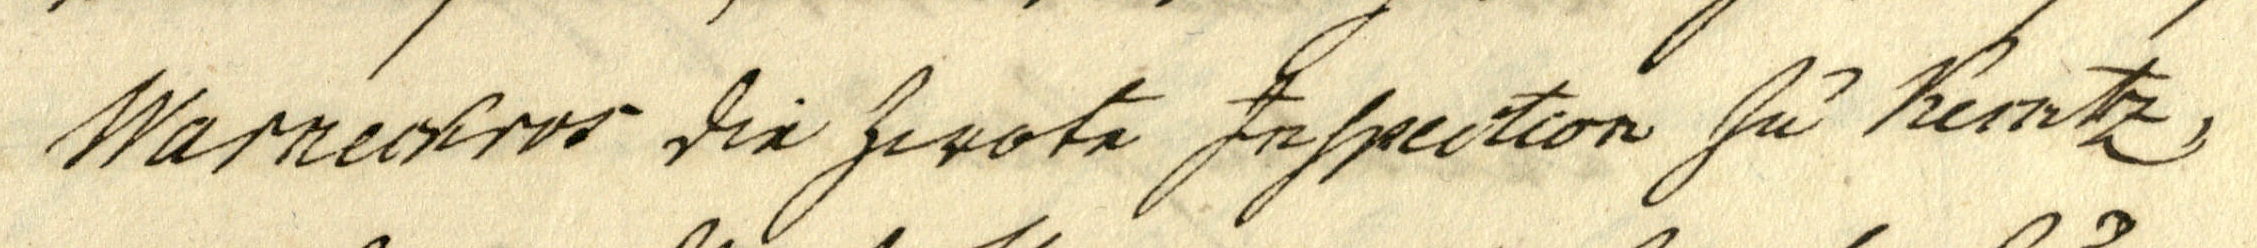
Warneckros die zwote Inspection zu Kemtz,
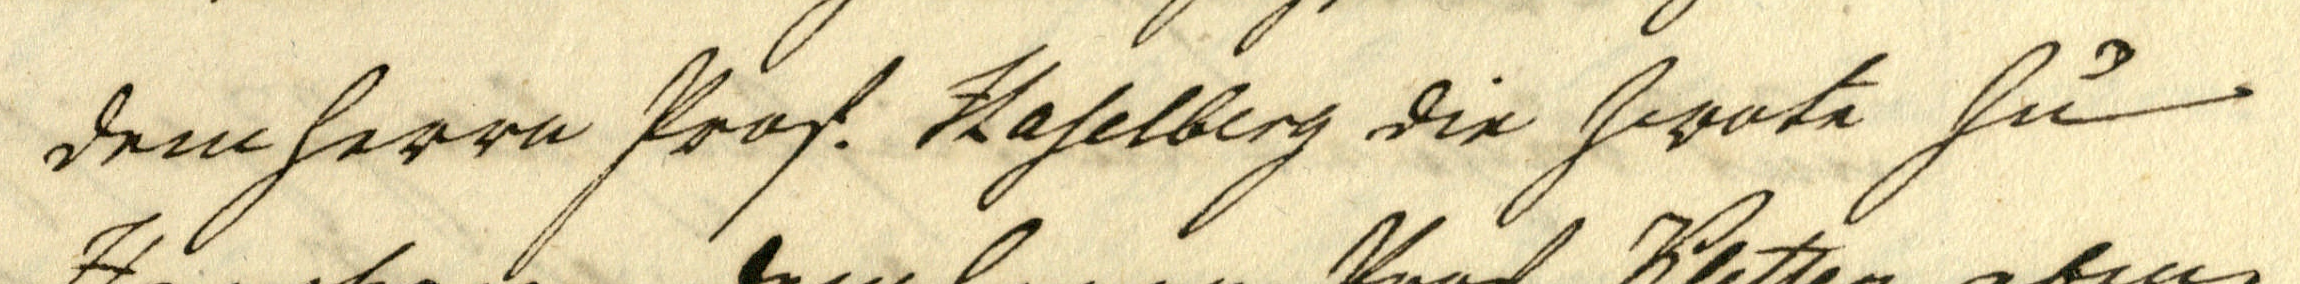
dem herrn Prof. Haselberg die zwote zu
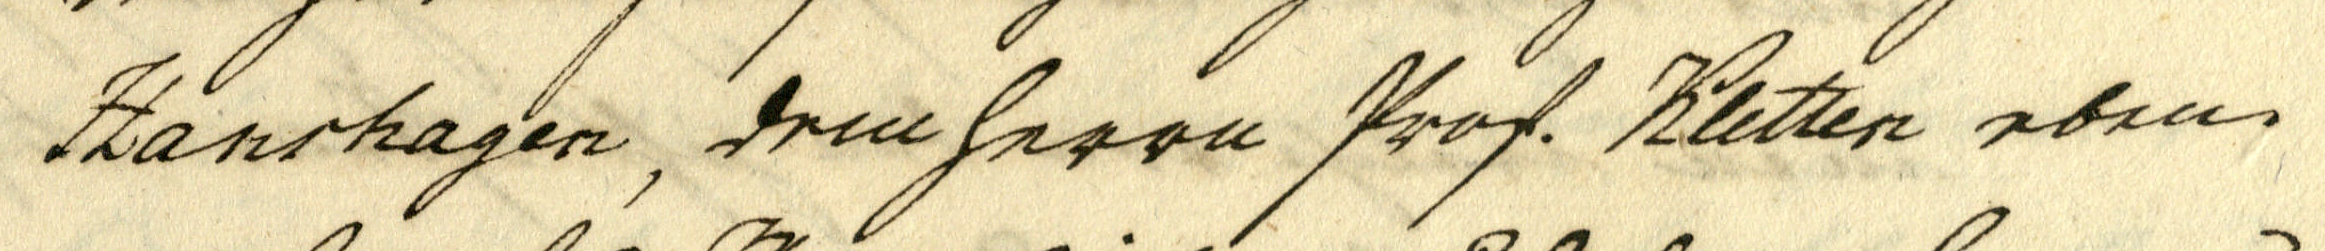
Hanshagen, dem herrn Prof. Kletten eben-
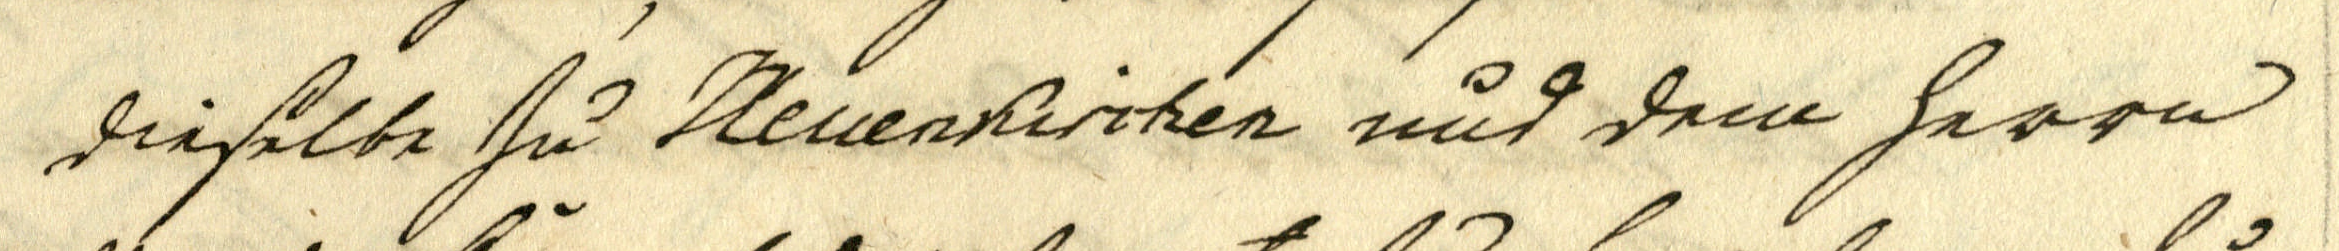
dieselbe zu Neuenkrichen und dem herrn
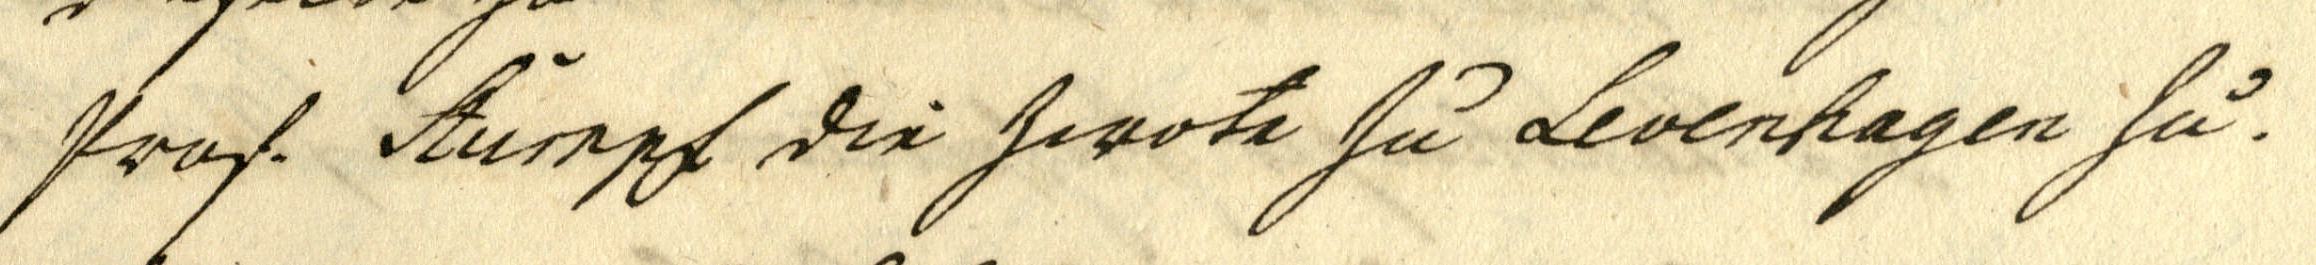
Prof. Stumpf die zwote zu Levenhagen zu-
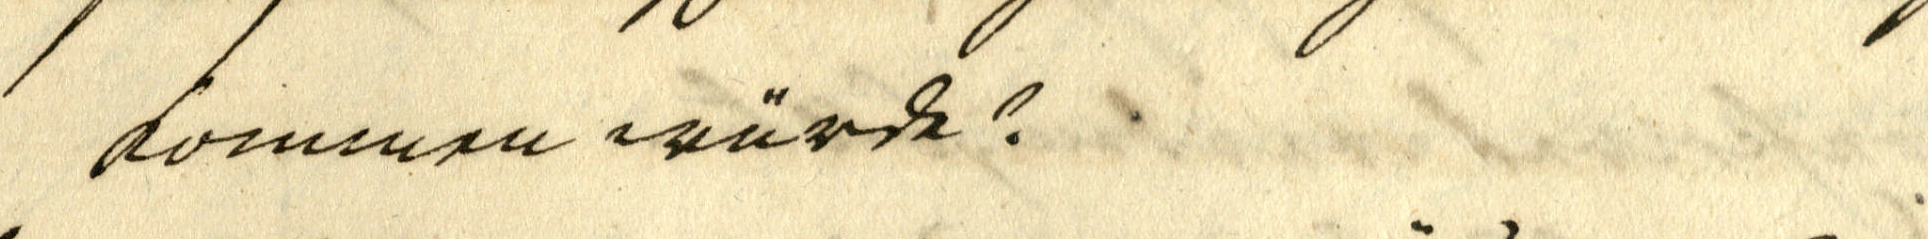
kommen würde?
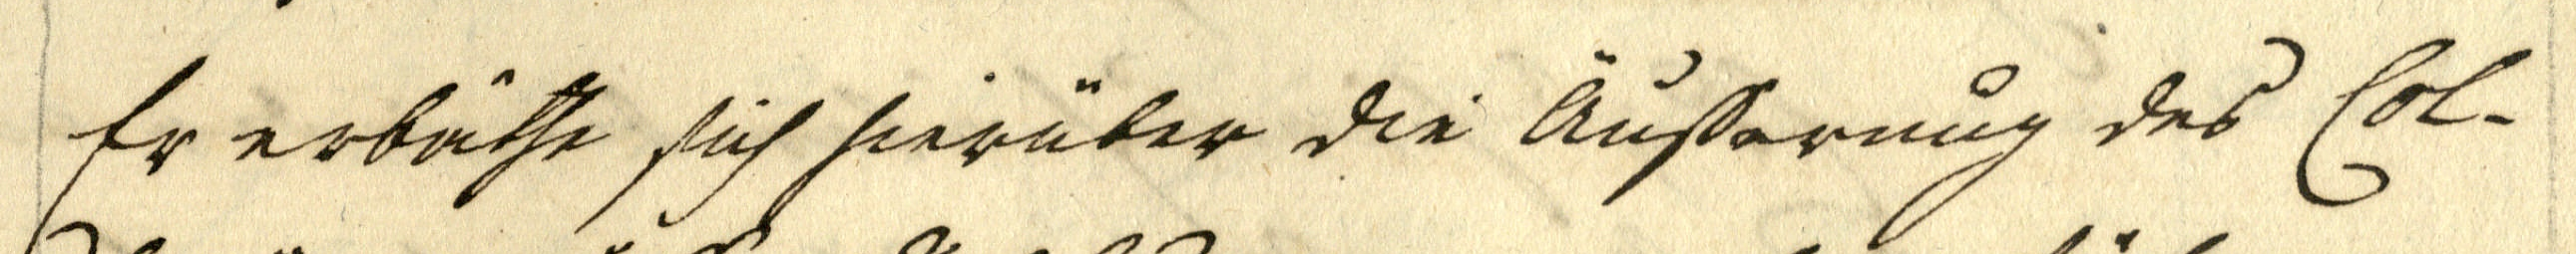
Er erbäthe sich hierüber die Äusserung des Col-
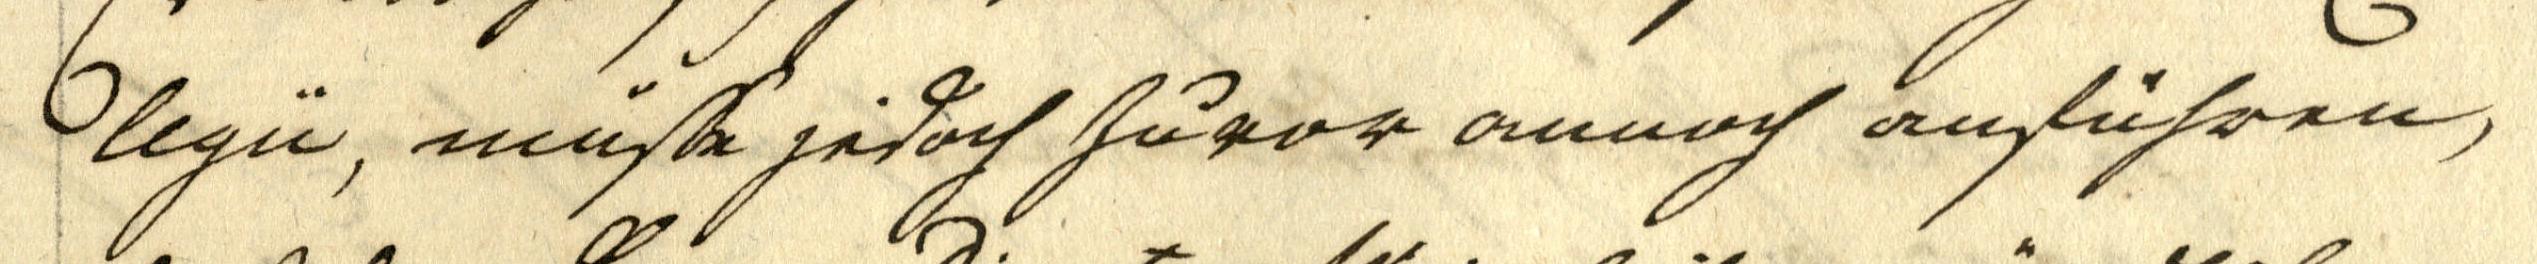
legii, müsse jedoch zuvor annoch anführen,
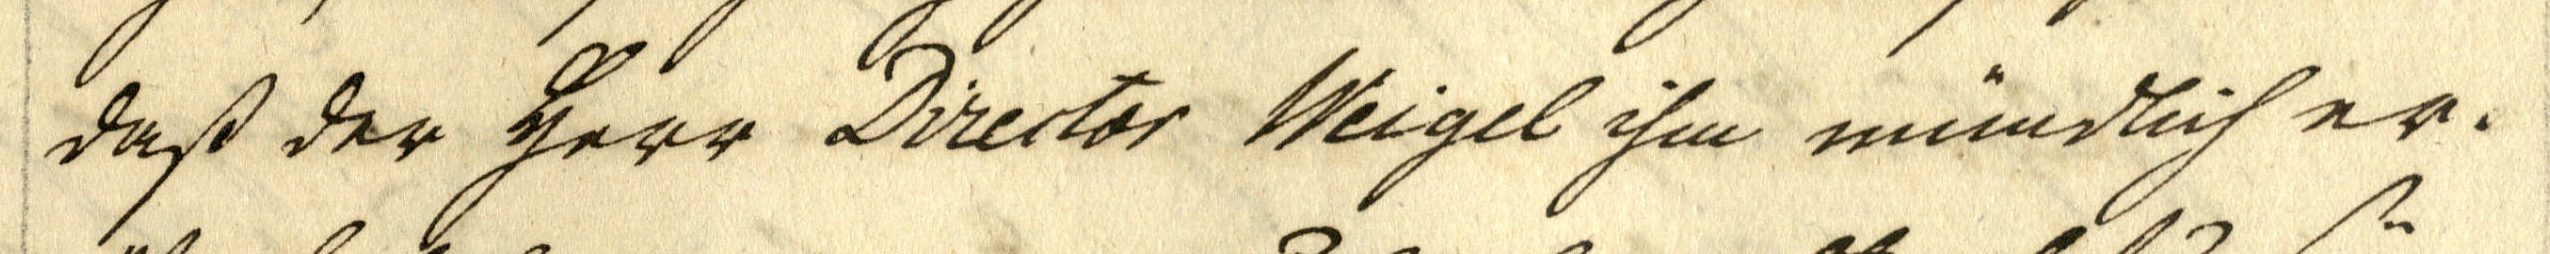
daß der Herr Director Weigel ihm mündlich er-
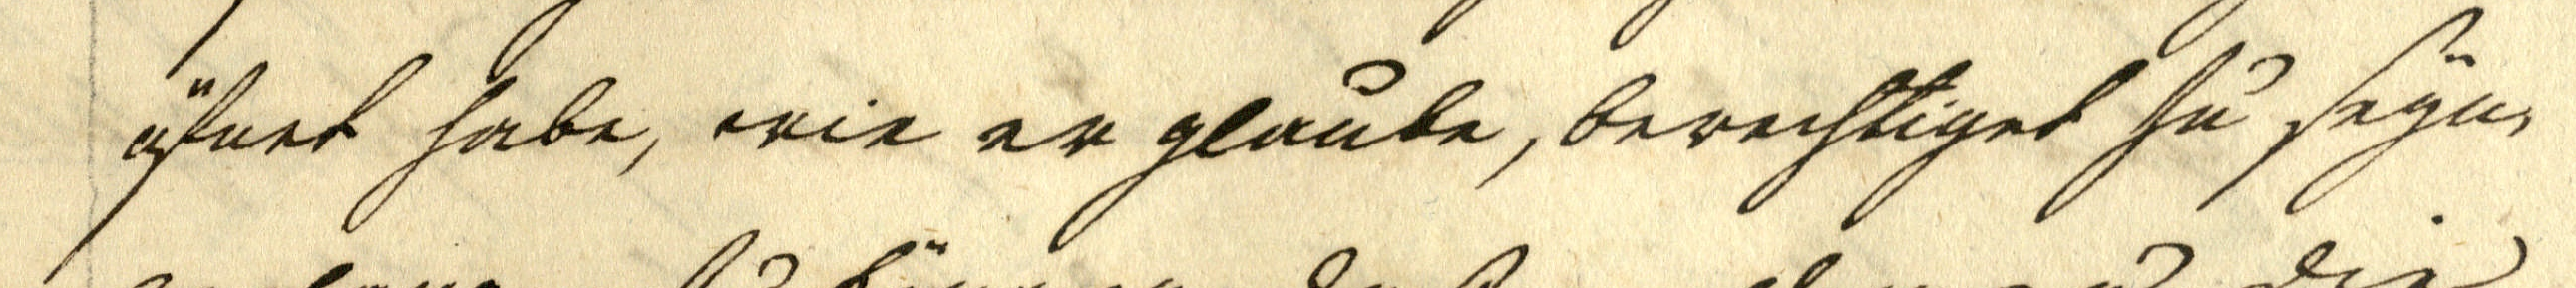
öfnet habe, wie er glaube, berechtiget zu seyn,
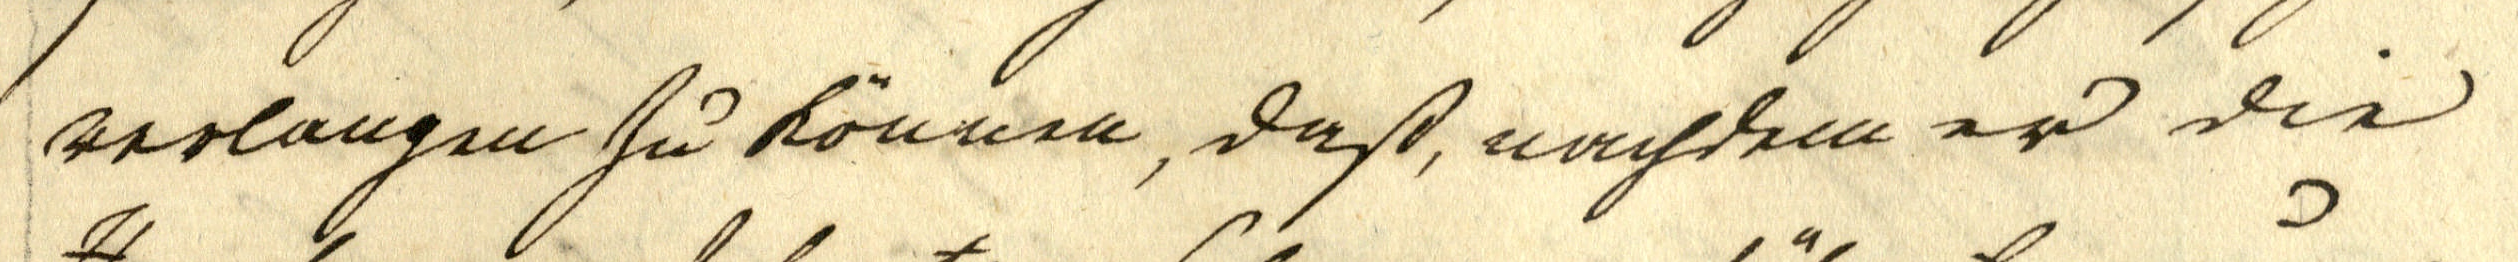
verlangen zu können, daß nachdem er die
